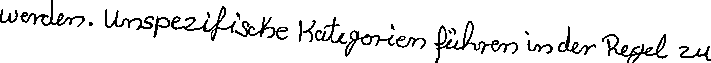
werden. Unspezifische Kategorien führen in der Regel zu
